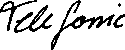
Telefonie
